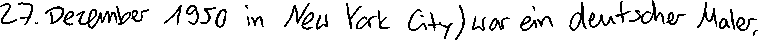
27. Dezember 1950 in New York City) war ein deutscher Maler,
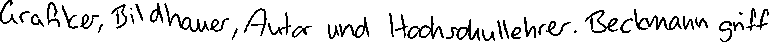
Grafiker, Bildhauer, Autor und Hochschullehrer. Beckmann griff
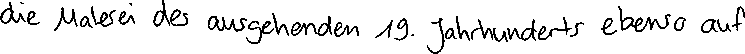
die Malerei des ausgehenden 19. Jahrhunderts ebenso auf
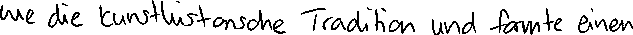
wie die kunsthistorische Tradition und formte einen
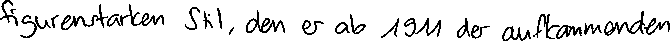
figurenstarken Stil, den er ab 1911 der aufkommenden
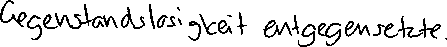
Gegenstandslosigkeit entgegensetzte.
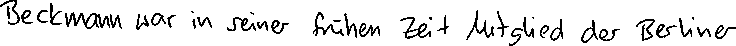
Beckmann war in seiner frühen Zeit Mitglied der Berliner
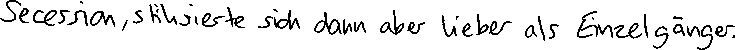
Secession, stilisierte sich dann aber lieber als Einzelgänger.
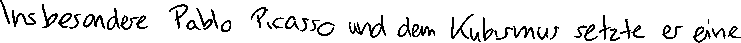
Insbesondere Pablo Picasso und dem Kubismus setzte er eine
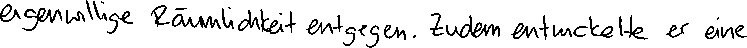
eigenwillige Räumlichkeit entgegen. Zudem entwickelte er eine
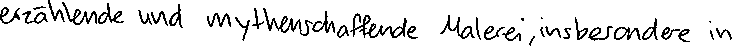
erzählende und mythenschaffende Malerei, insbesondere in
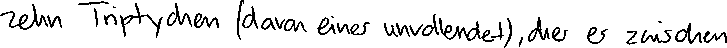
zehn Triptychen (davon eines unvollendet), die er zwischen
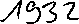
1932
